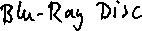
Blu-ray Disc
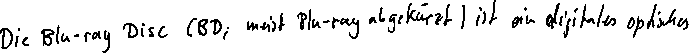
Die Blu-ray Disc (BD; meist Blu-ray abgekürzt) ist ein digitales optisches
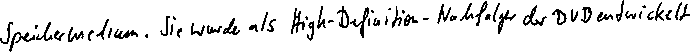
Speichermedium. Sie wurde als High-Definition-Nachfolger der DVD entwickelt
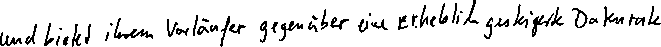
und bietet ihrem Vorläufer gegenüber eine erheblich gesteigerte Datenrate
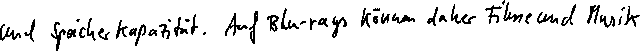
und Speicherkapazität. Auf Blu-rays können daher Filme und Musik
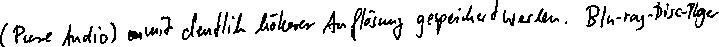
(Pure Audio) mit deutlich höherer Auflösung gespeichert werden. Blu-ray-Disc-Player
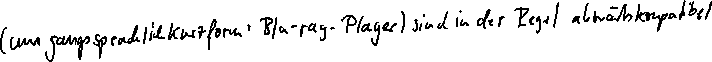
umgangssprachliche Kurzform: Blu-ray-Player) sind in der Regel abwärtskompatibel
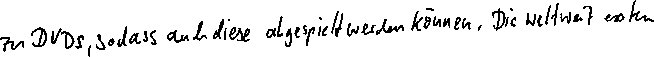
zu DVDs, sodass auch diese abgespielt werden können. Die weltweit ersten
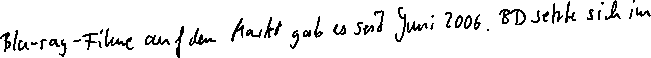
Blu-ray-Filme auf dem Markt gab es seit Juni 2006. BD setzte sich im
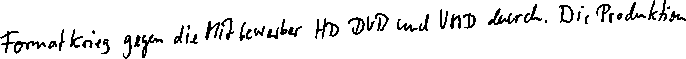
Formatkrieg gegen die Mitbewerber HD DVD und VMD durch. Die Produktion
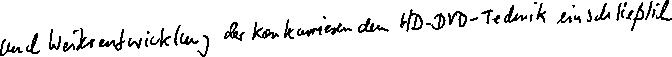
und Weiterentwicklung der konkurrierenden HD-DVD-Technik einschließlich
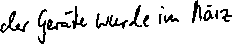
der Geräte wurde im März
